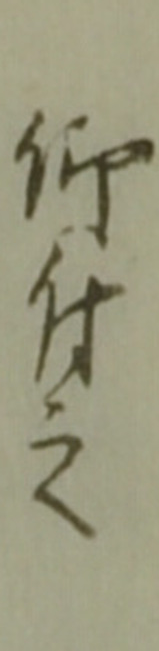仰付之
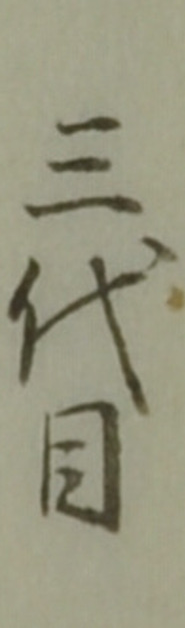三代目
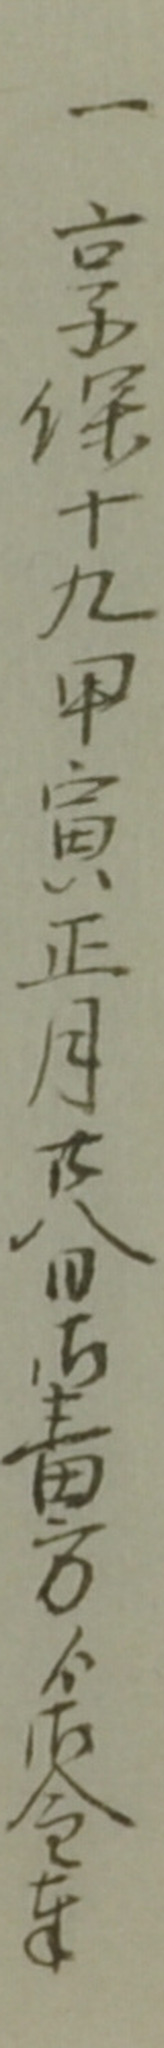一享保十九甲寅正月廿八日御番方ゟ御金奉
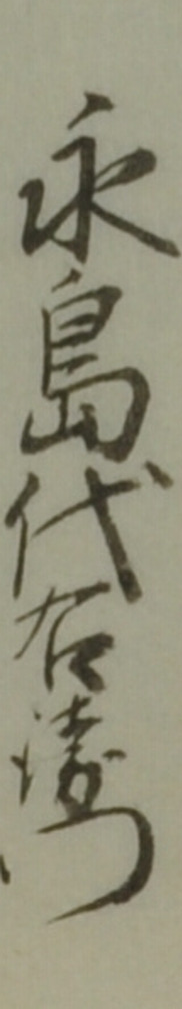永島代右衛門
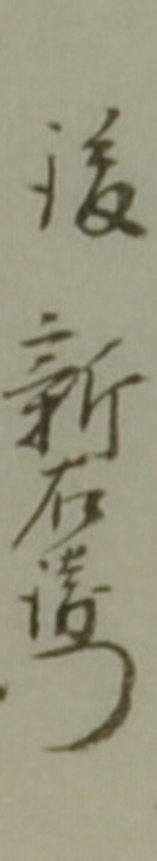後新右衛門
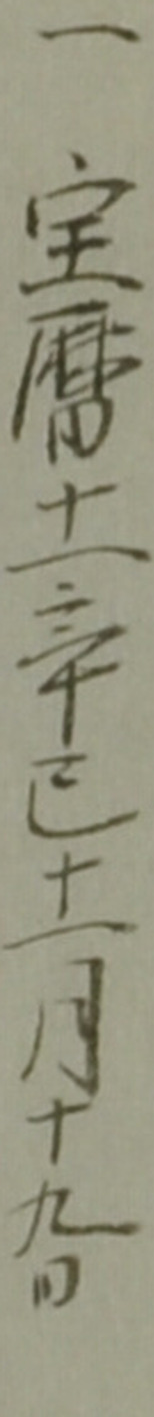一宝暦十一辛巳十一月十九日
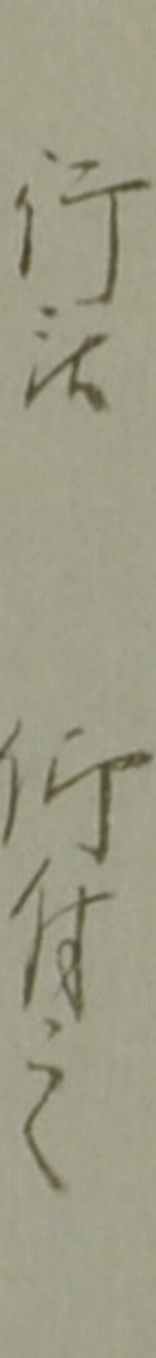行被仰付之
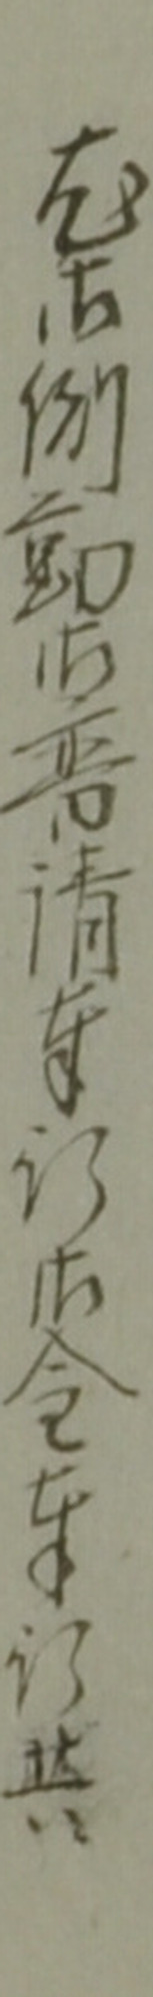尤御側勤御普請奉行御金奉行共
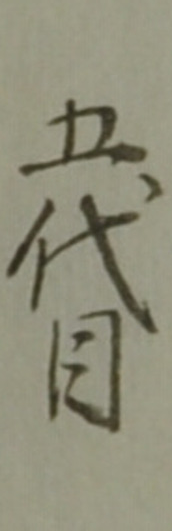五代目
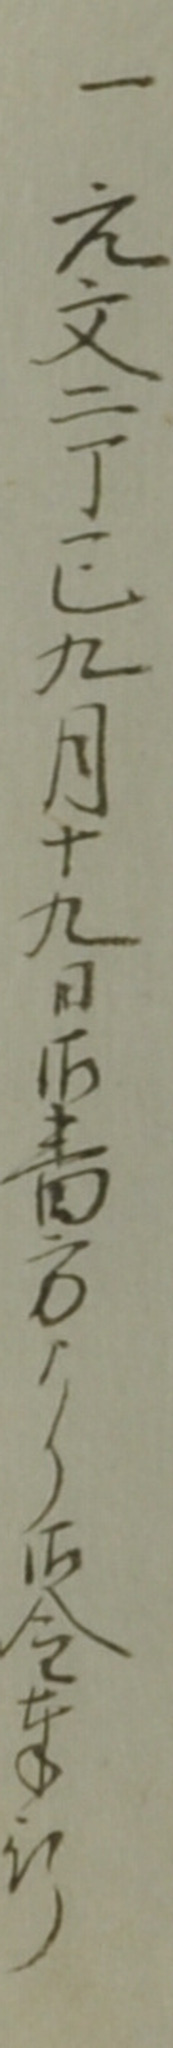一元文二丁巳九月十九日御番方より御金奉行
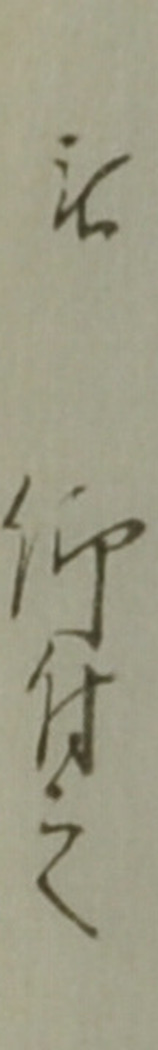被仰付之
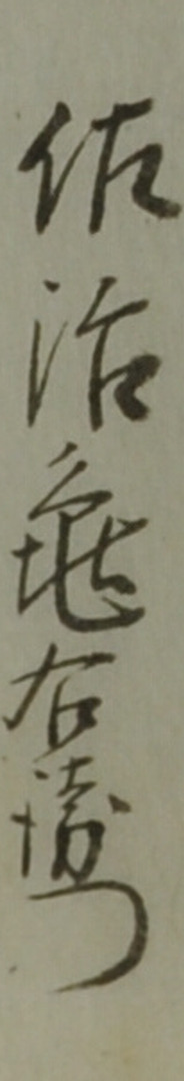佐治亀右衛門

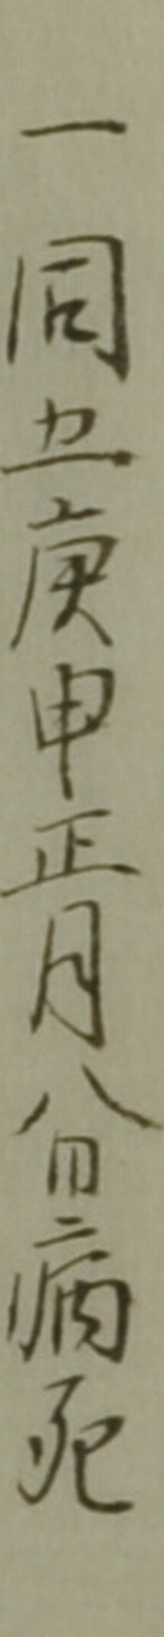一同五庚申正月八日病死
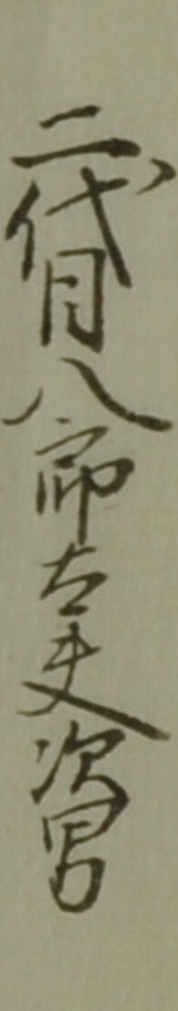二代目八郎太夫次男
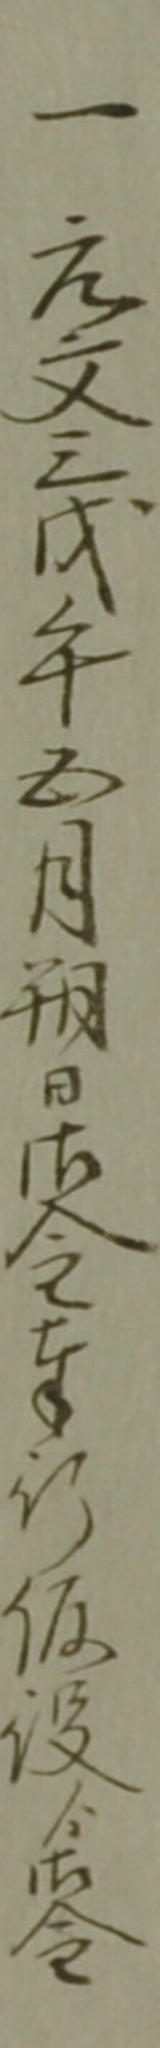一元文三戊午五月朔日御金奉行仮役ゟ御金
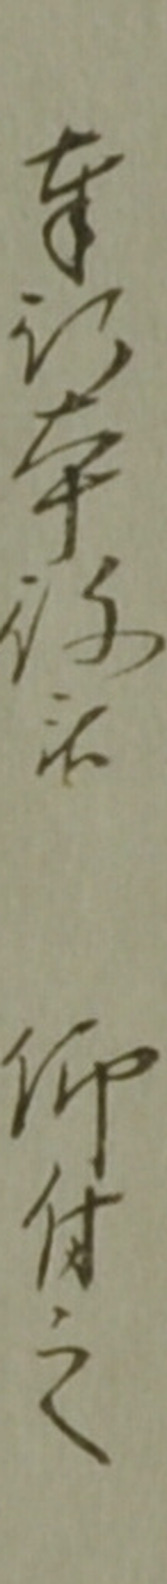奉行本役被仰付之
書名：諸御役代々録（七）
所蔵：伊那市立高遠町図書館・合同会社AMANE
